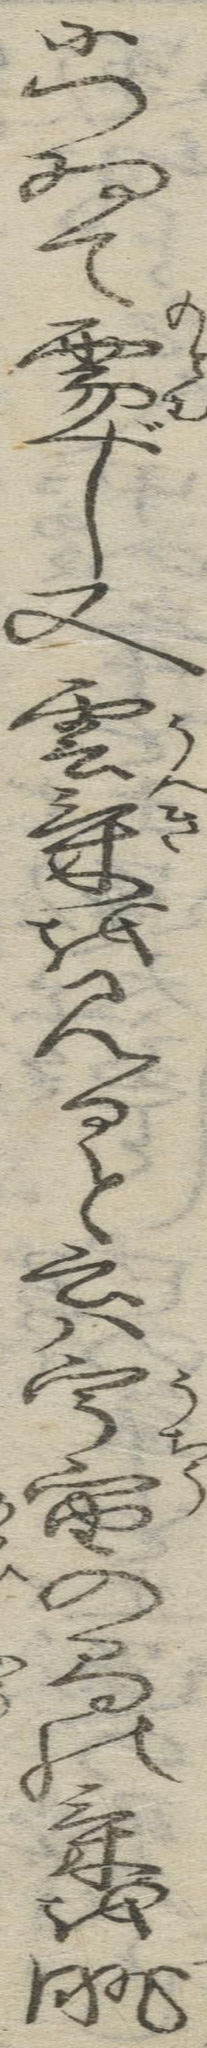につゐて需べし又雲気を見ると云うは宇宙の間の気を眺
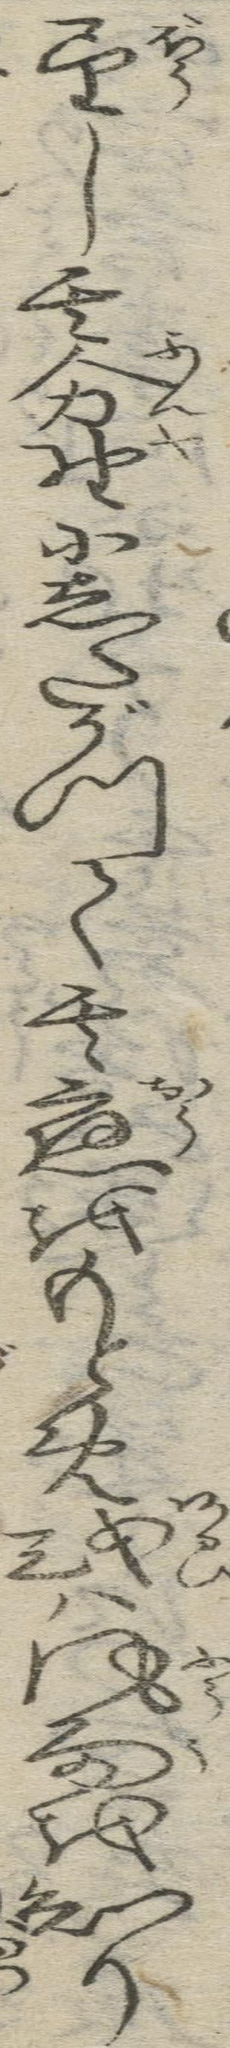望し其分野にしたがつて其応をもとめ或は風雨を知り
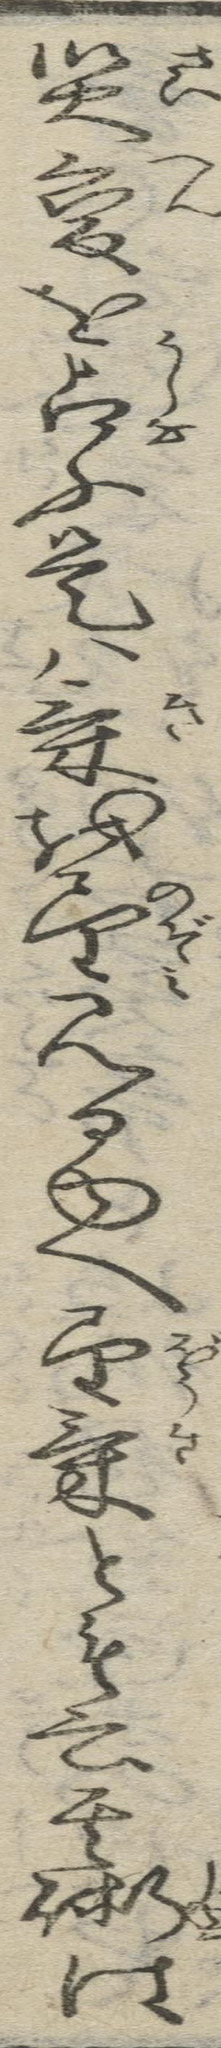災変を占ふ是は気を望見るゆへ望気とも云其術は
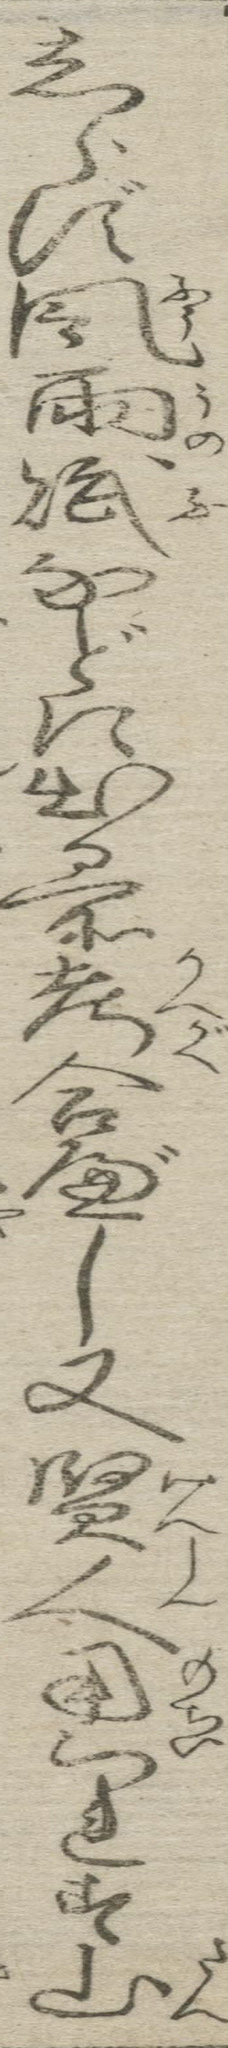しらず風雨賦などに出る所考合べし又賢人の用られす山
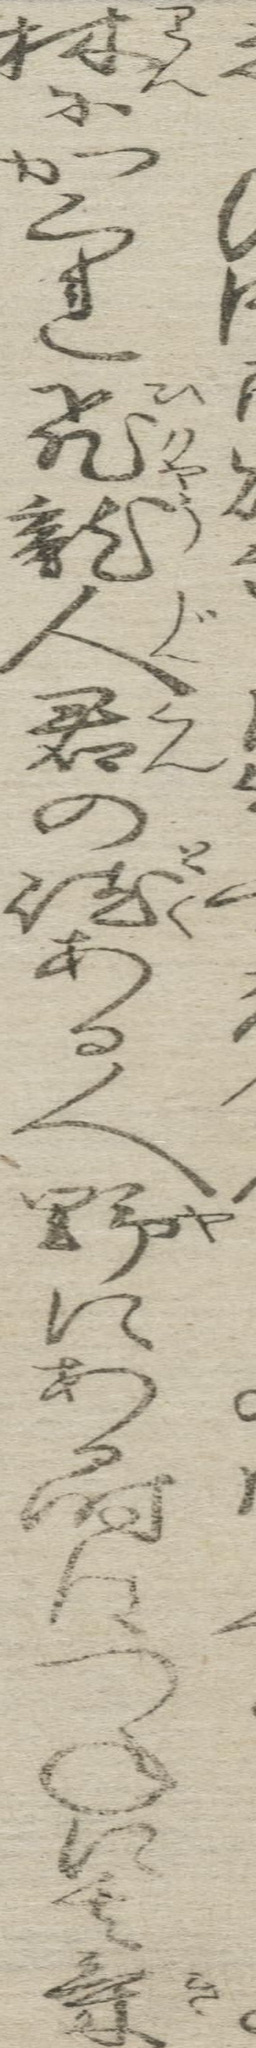林にかくれ飛竜人君の徳ある人之にある時につねに其気
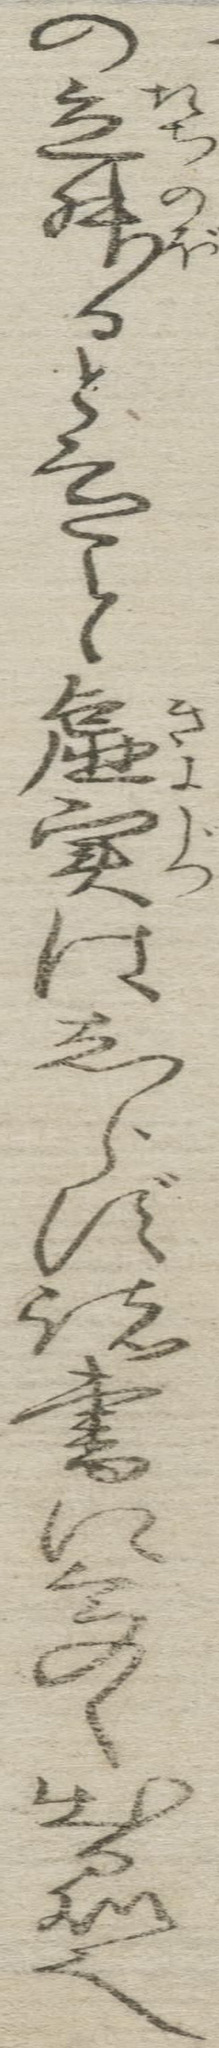の立升ると云こと虚実はしらず諸書に多く出る処也
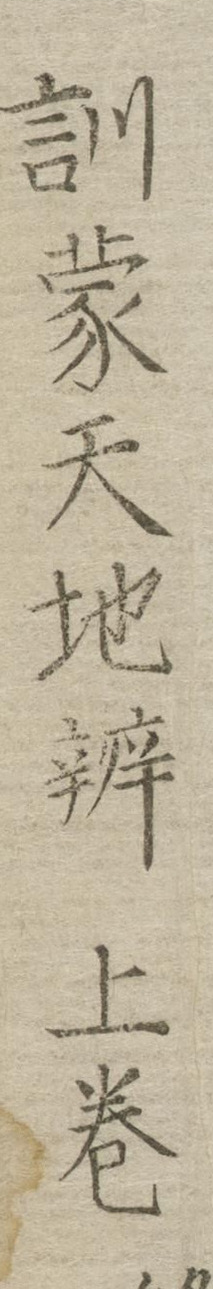訓蒙天地弁上巻終
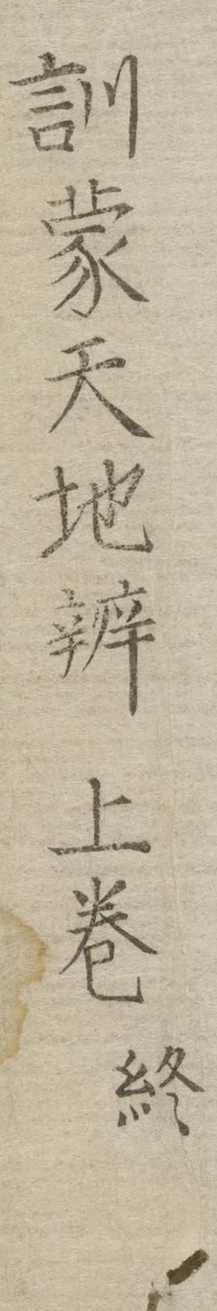訓蒙天地弁上巻終
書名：訓蒙天地辨　天
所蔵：東京大学地震研究所図書室 Earthquake Research Institute Library, The University of Tokyo, JAPAN
